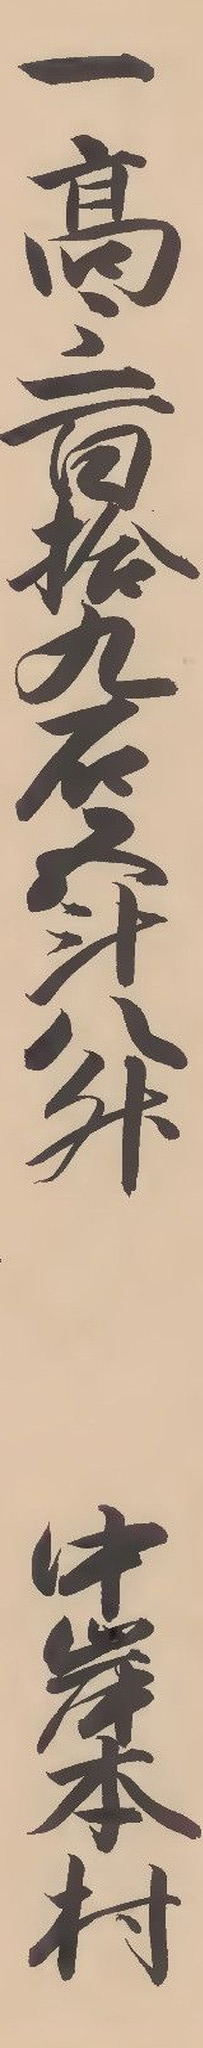一高三百拾九石五斗八升中岸本村
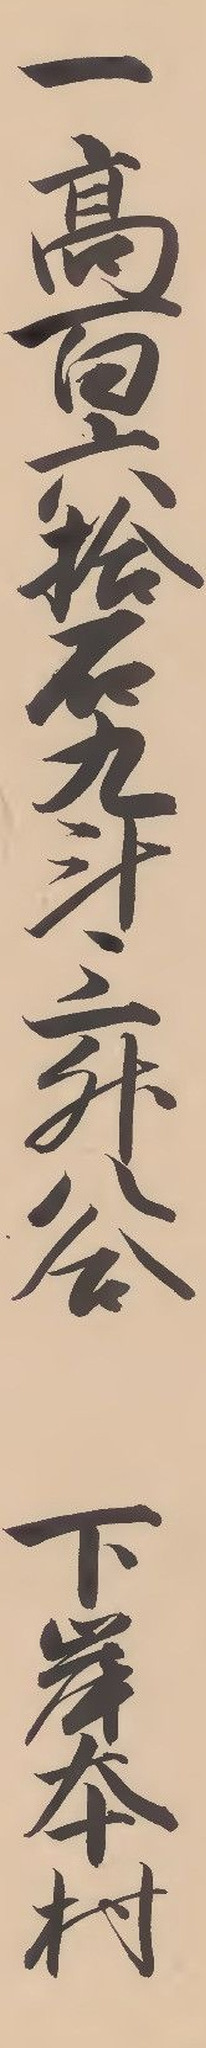一高百六拾石九斗三升八合下岸本村
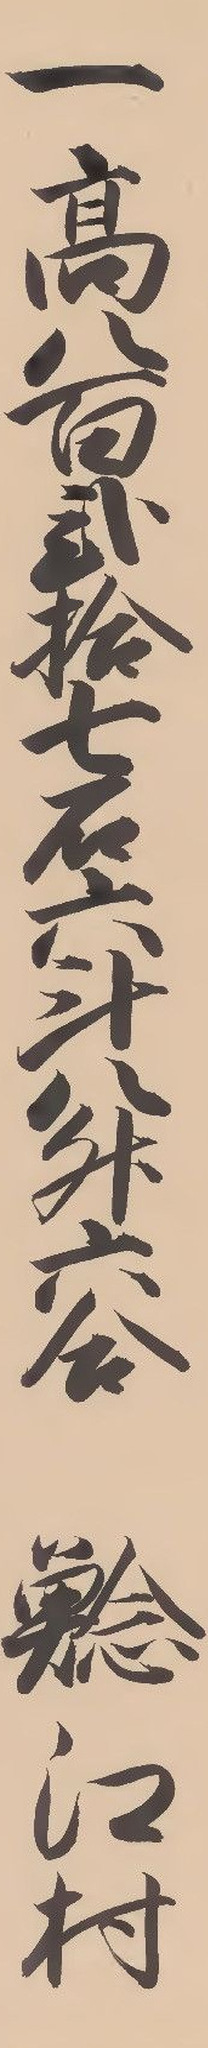一高八百弐拾七石六斗八升六合鯰江村
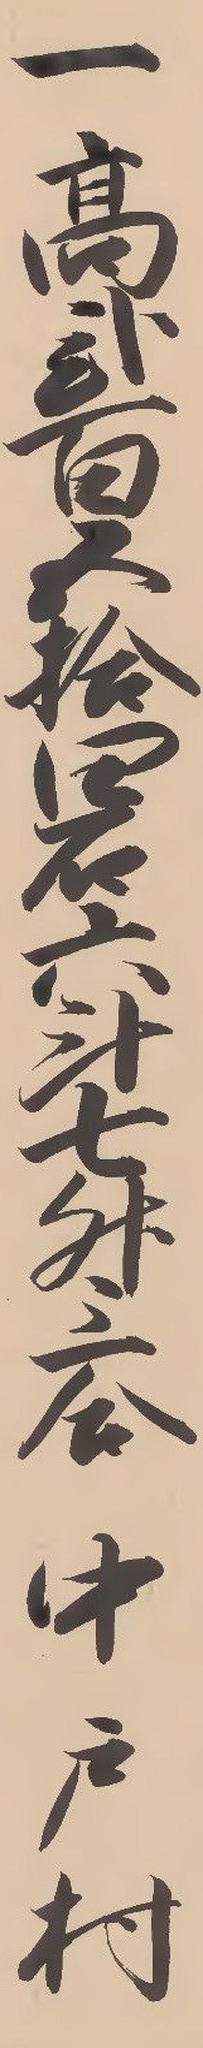一高弐百五拾四石六斗七升三合中戸村
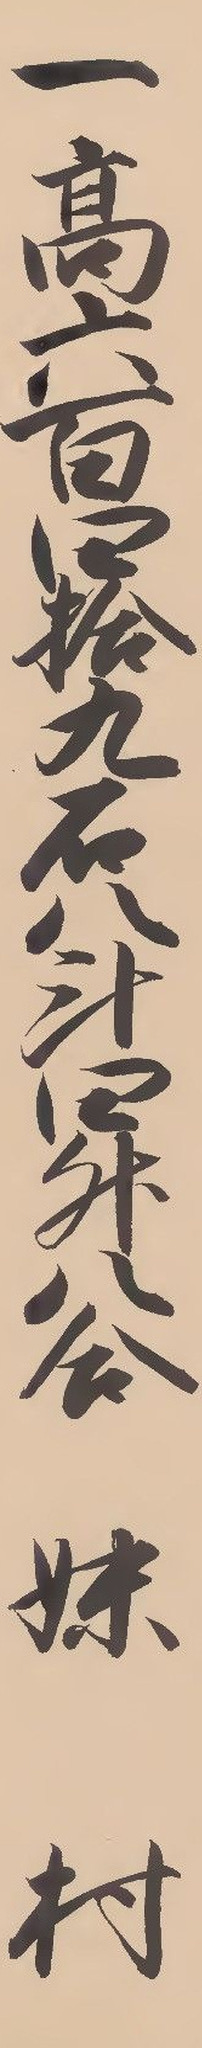一高六百四拾九石八斗四升八合妹村

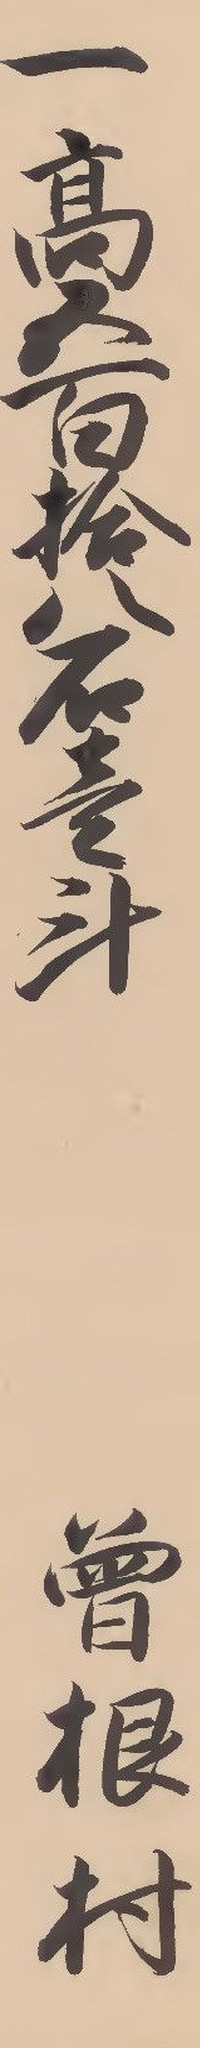一高五百拾八石壱斗曽根村
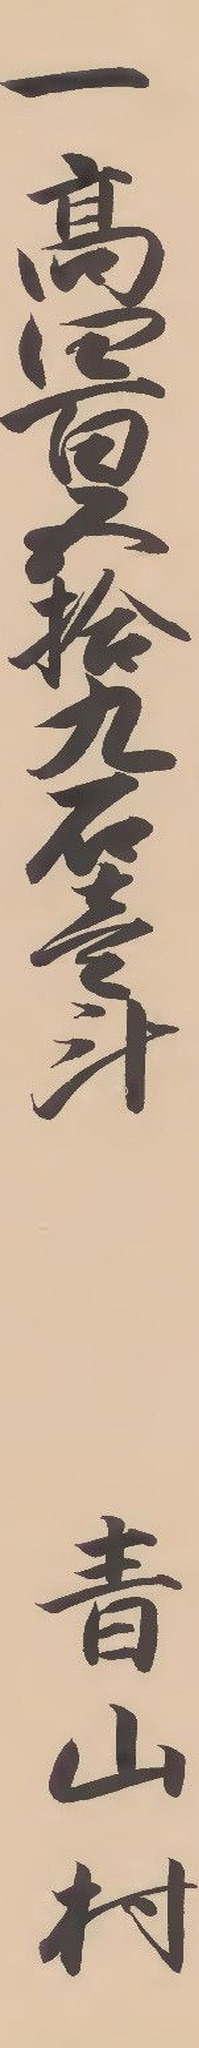一高四百五拾九石壱斗青山村
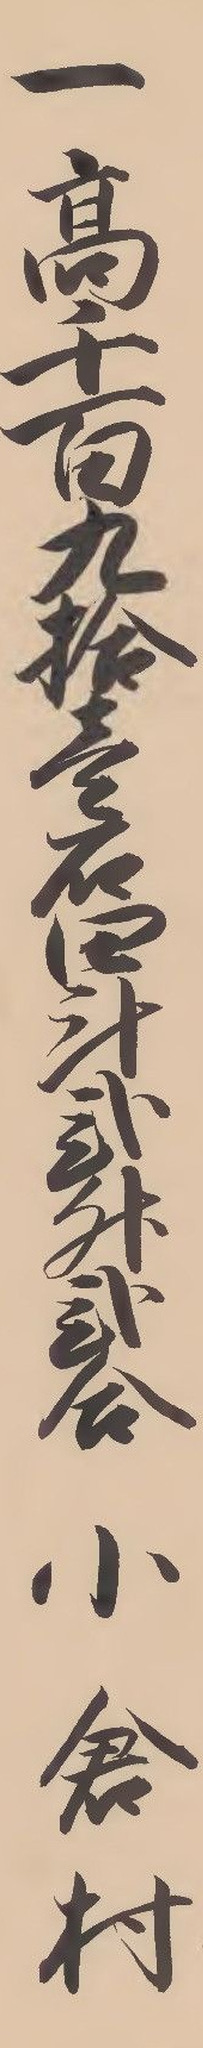一高千百九拾壱石四斗弐升弐合小倉村
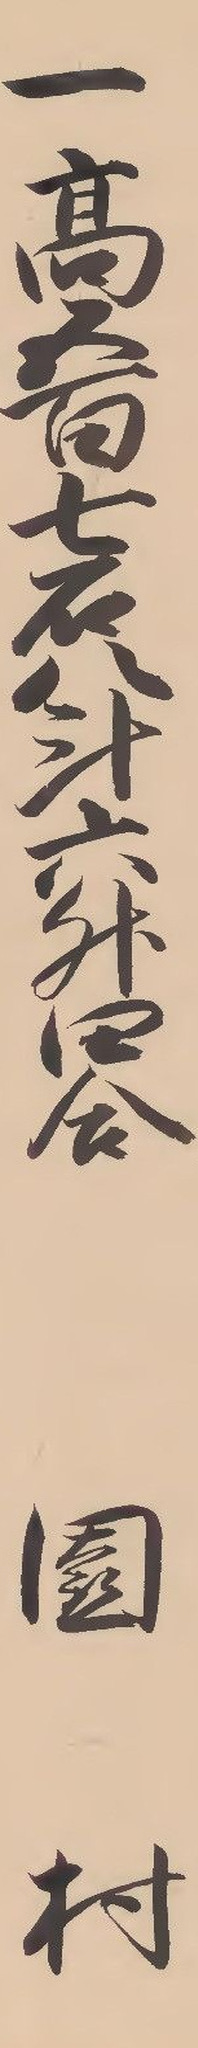一高五百七石八斗六升四合園村
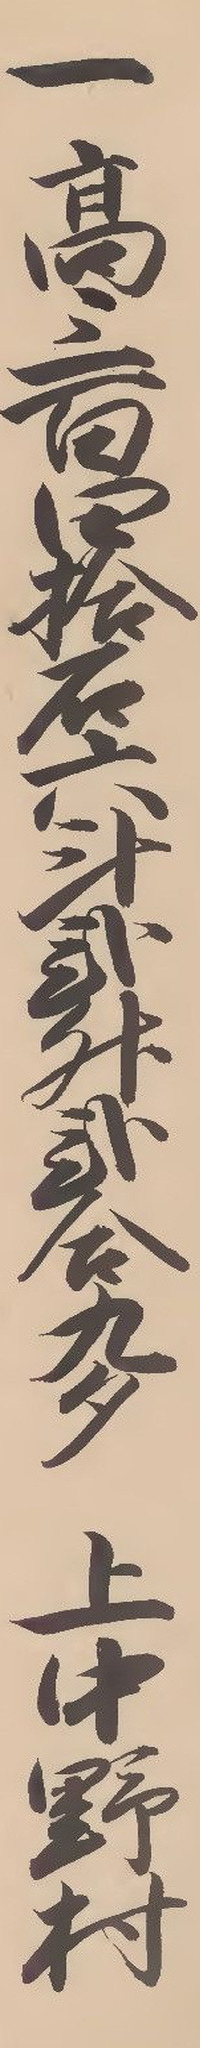一高三百四拾石六斗弐升弐合九勺上中野村
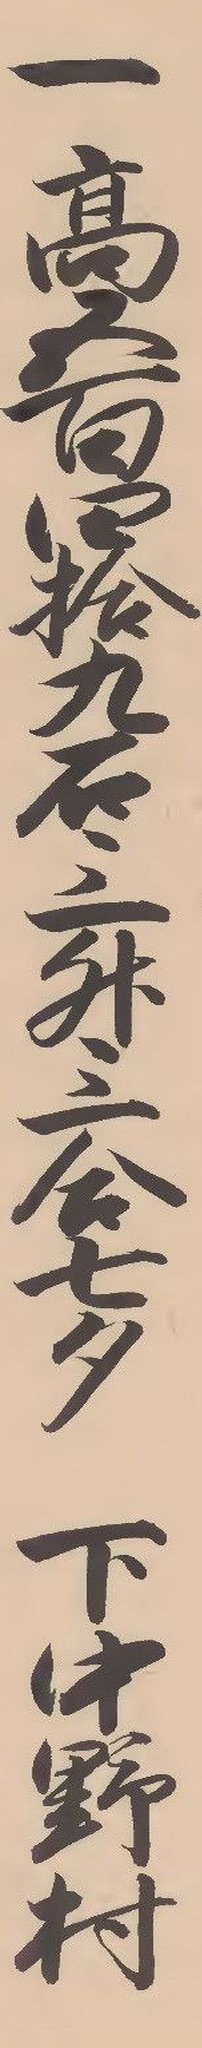一高五百四拾九石三升三合七勺下中野村
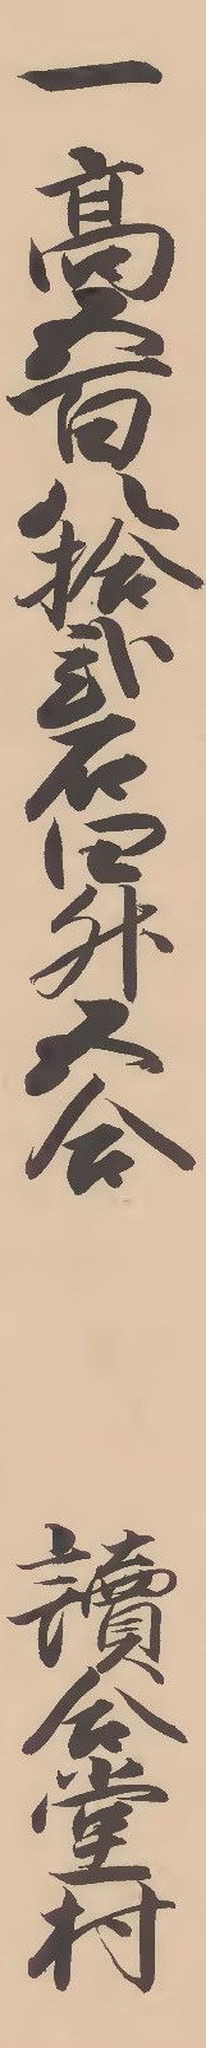一高五百八拾弐石四升五合読合堂村
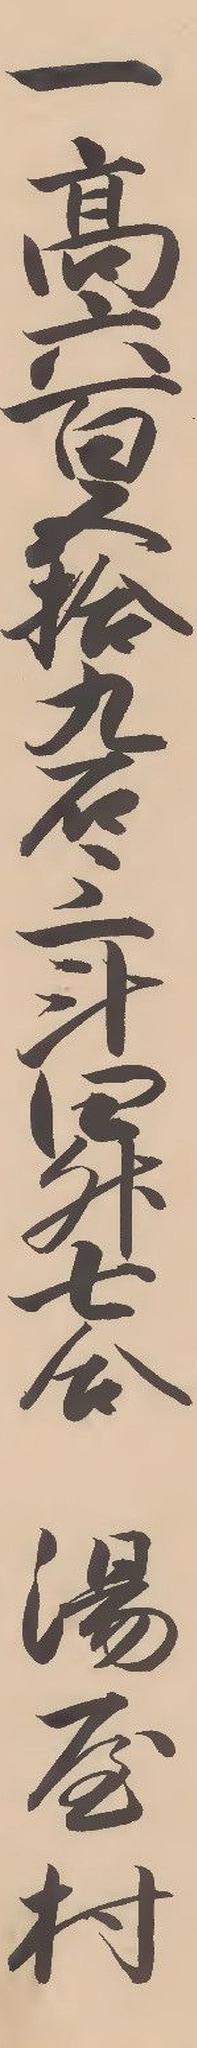一高六百五拾九石三斗四升七合湯屋村

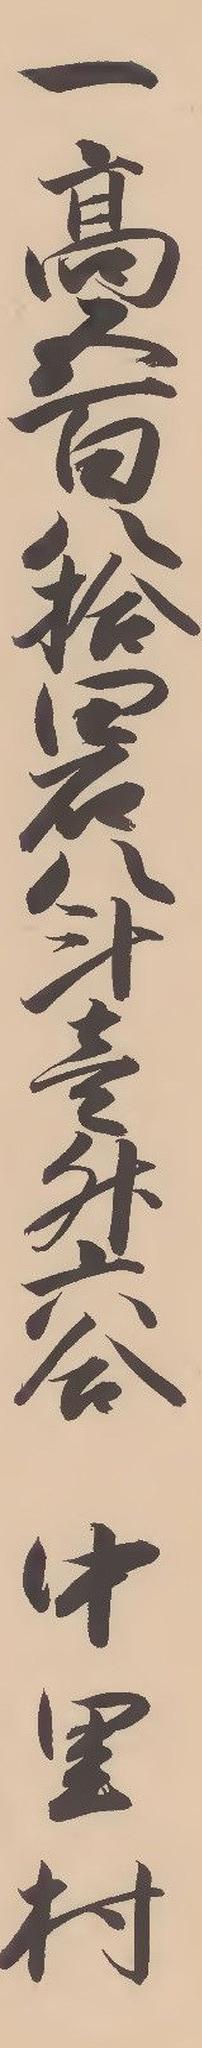一高五百八拾四石八斗壱升六合中里村
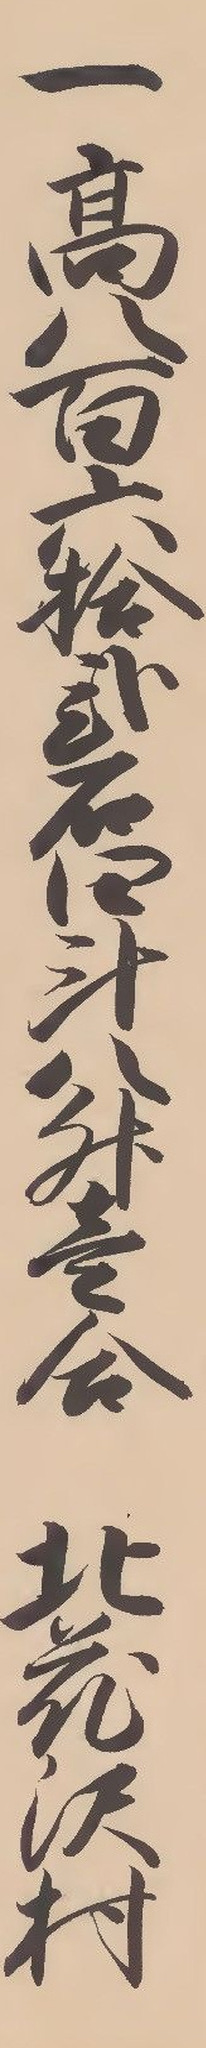一高八百六拾弐石四斗八升壱合北花沢村
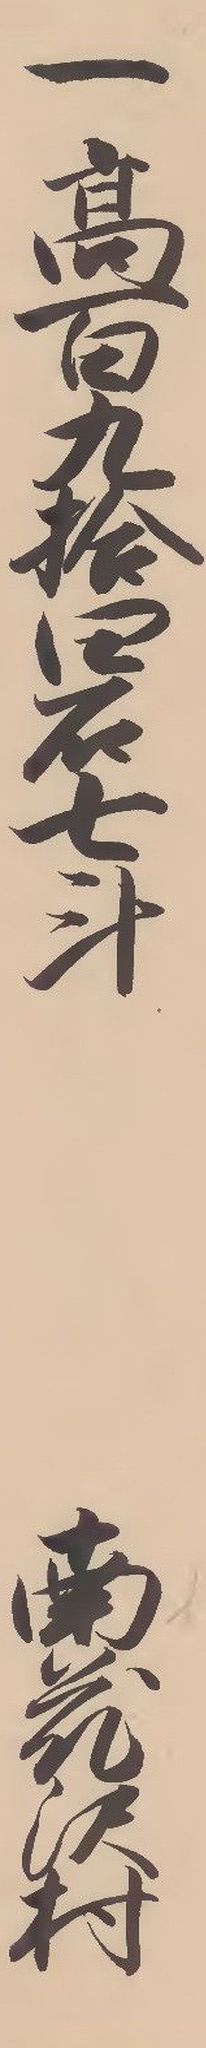一高百九拾四石七斗南花沢村
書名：近江国郷帳
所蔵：国立公文書館 National Archives of Japan
